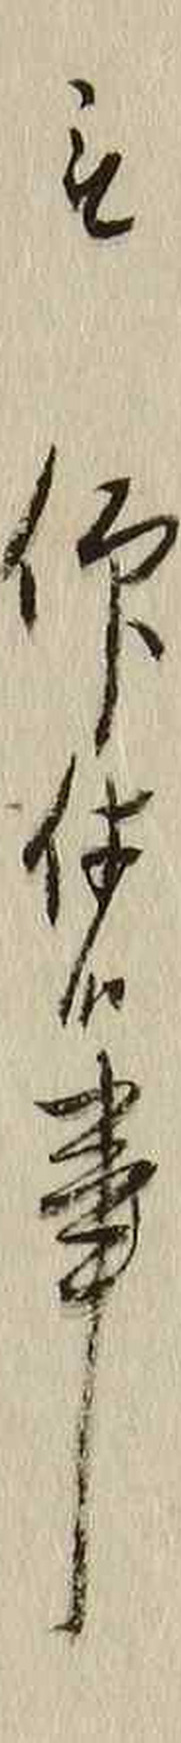被仰付候事
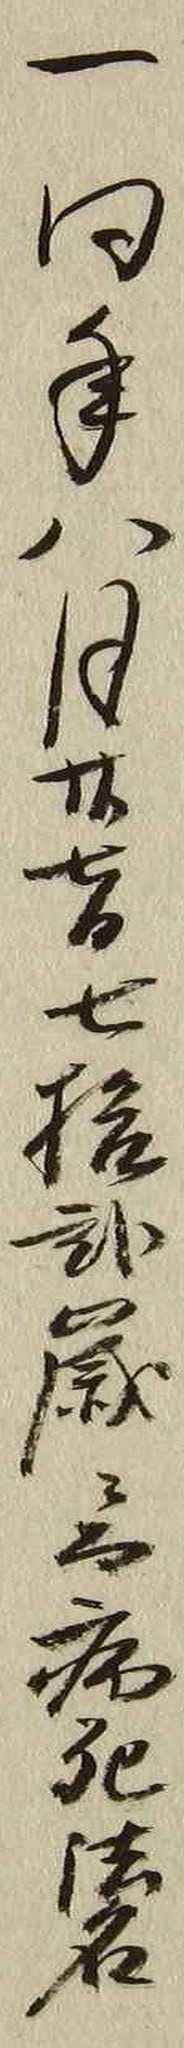一同年八月廿七日七拾弐歳ニ而病死法名
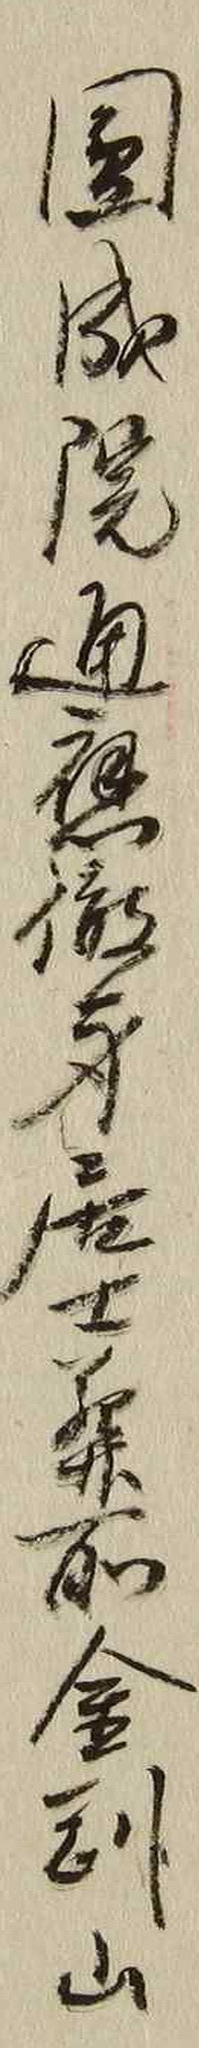円成院通応徹身居士葬所金剛山
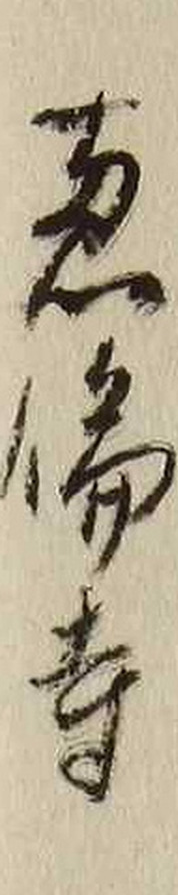恵倫寺
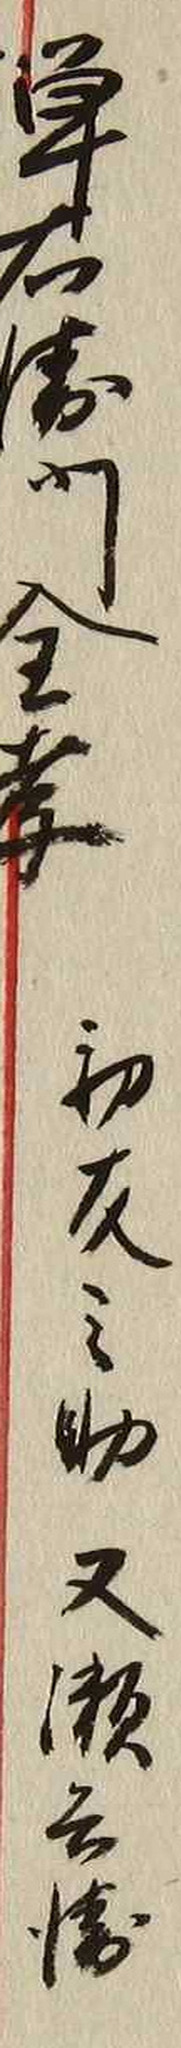弾右衛門全孝初友之助又瀬兵衛
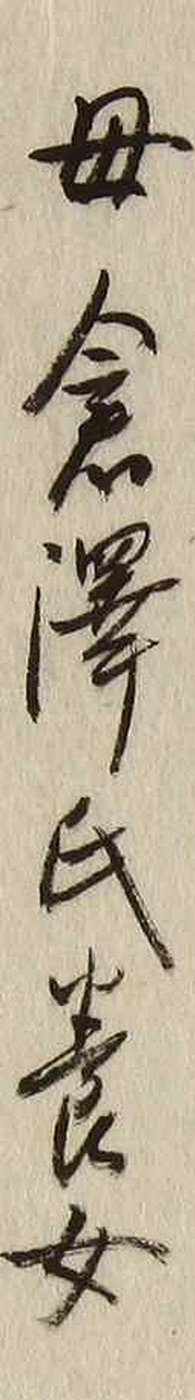母倉沢氏養女
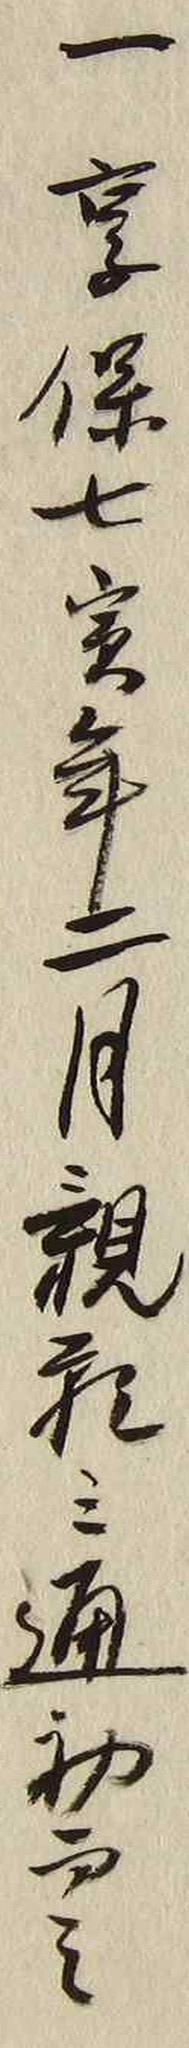一享保七寅年二月親願之通初而之
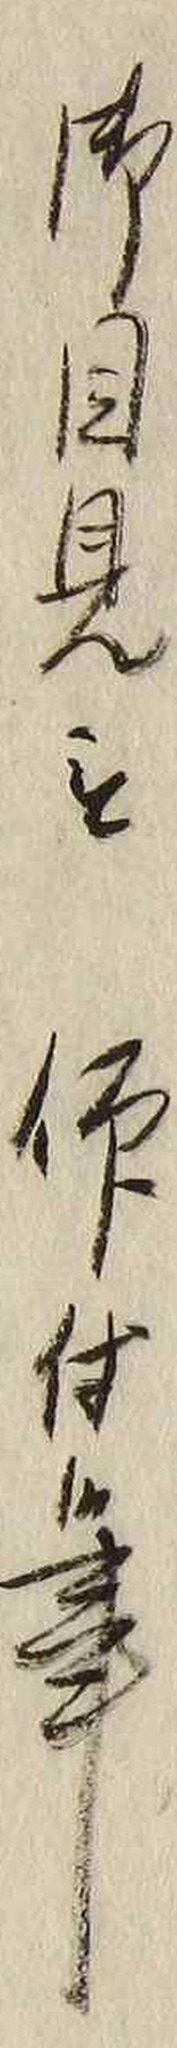御目見被仰付候事
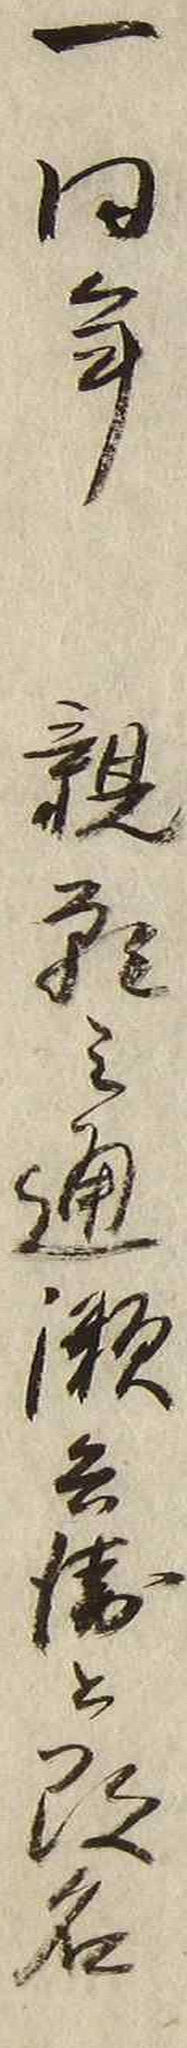一同年親願之通瀬兵衛と改名

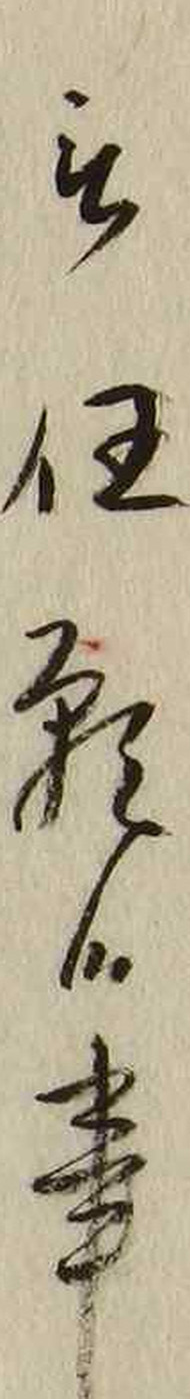被任願候事
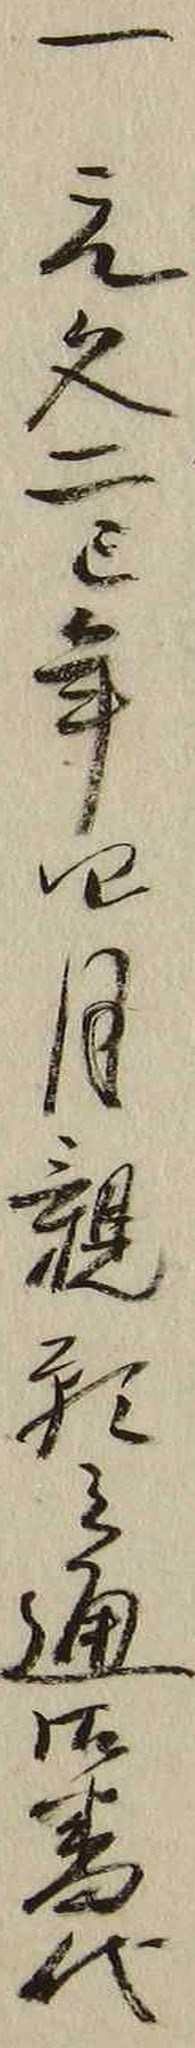一元文二巳年四月親願之通御番代
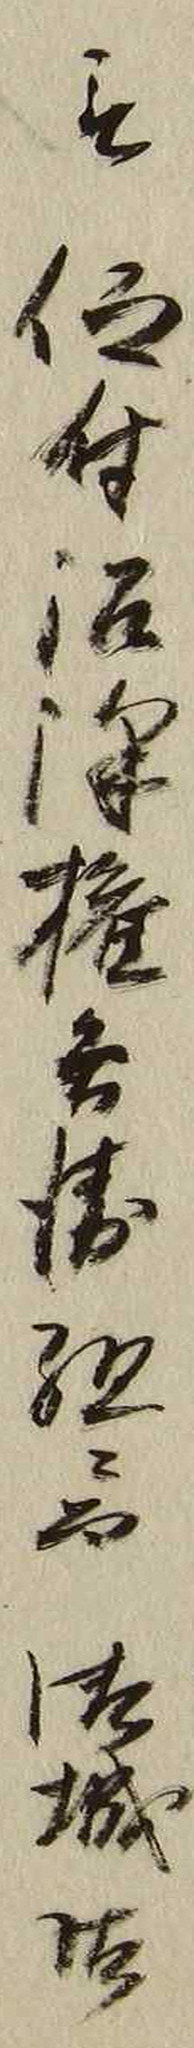被仰付沼沢権兵衛組ニ而御城御
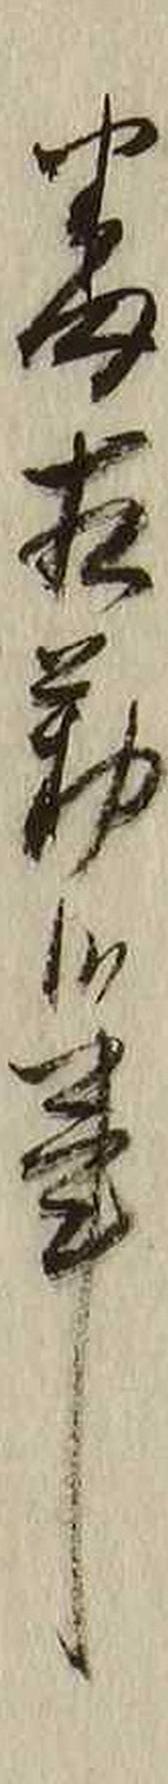番相勤候事
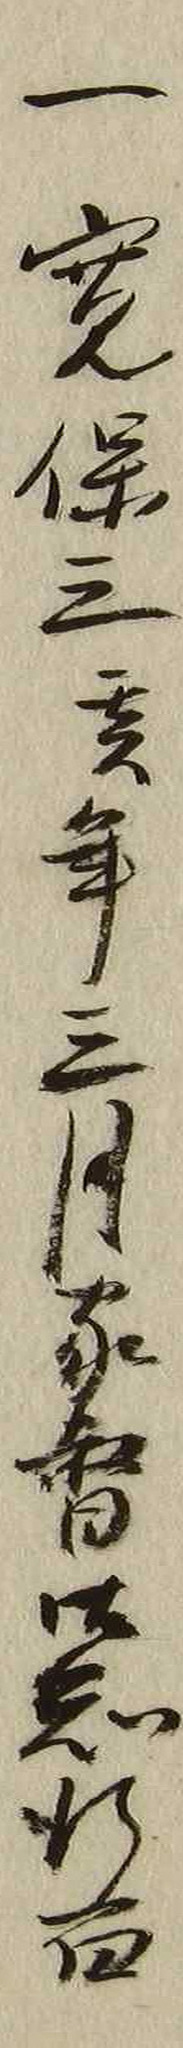一寛保三亥年三月家督御知行百
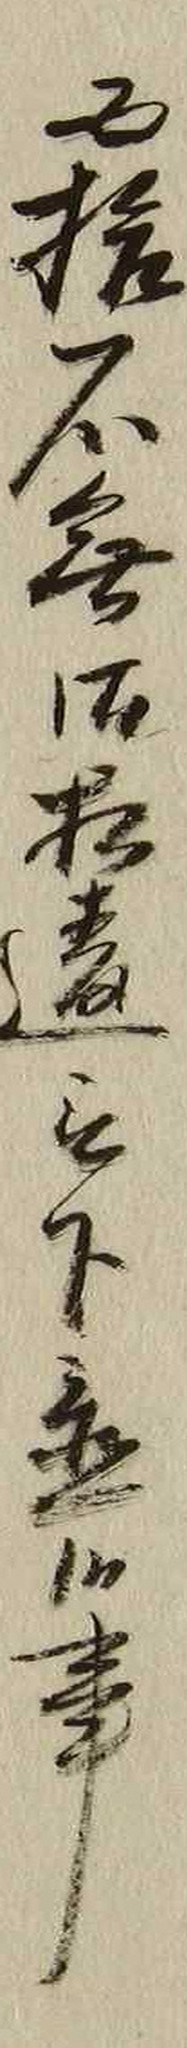五拾石無御相違被下置候事
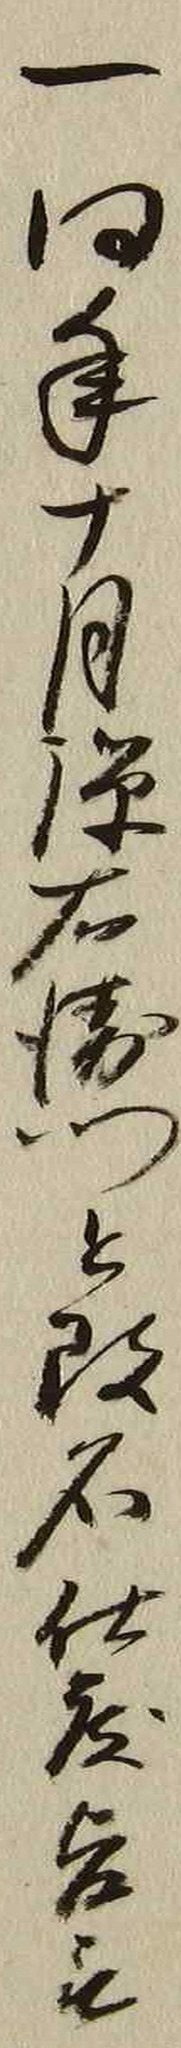一同年十月弾右衛門と改名仕度旨被
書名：諸士系譜　巻之346　も之部2
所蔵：会津若松市立会津図書館
